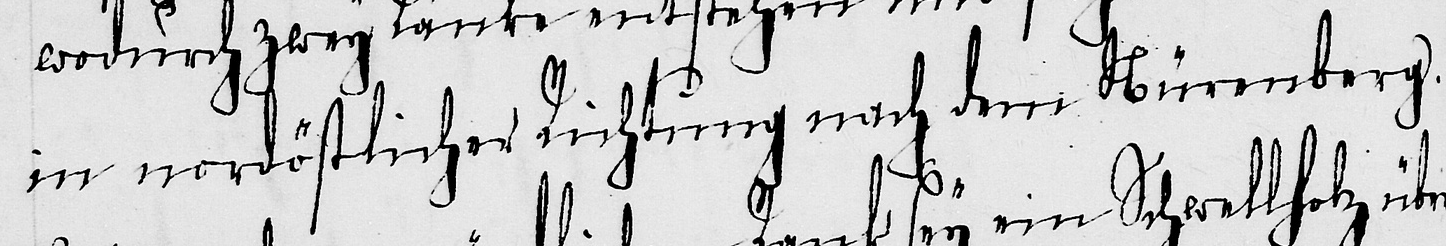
in nordöstlicher Richtung nach dem Nürenberg.
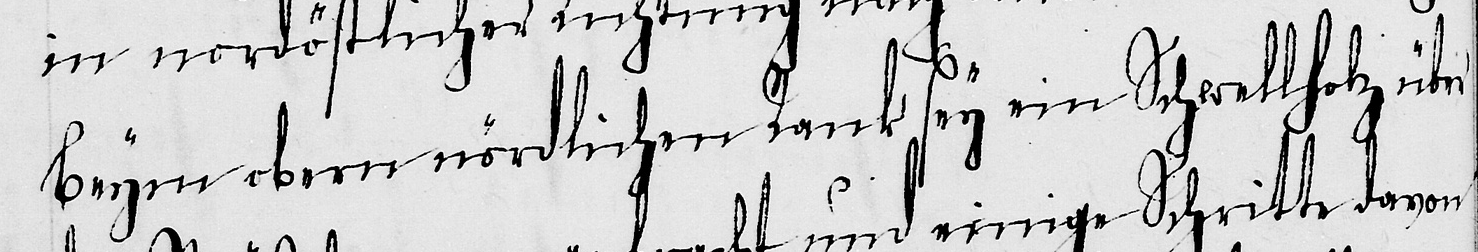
Beym obern nördlichen Rank sey ein Schwellholz üb¬
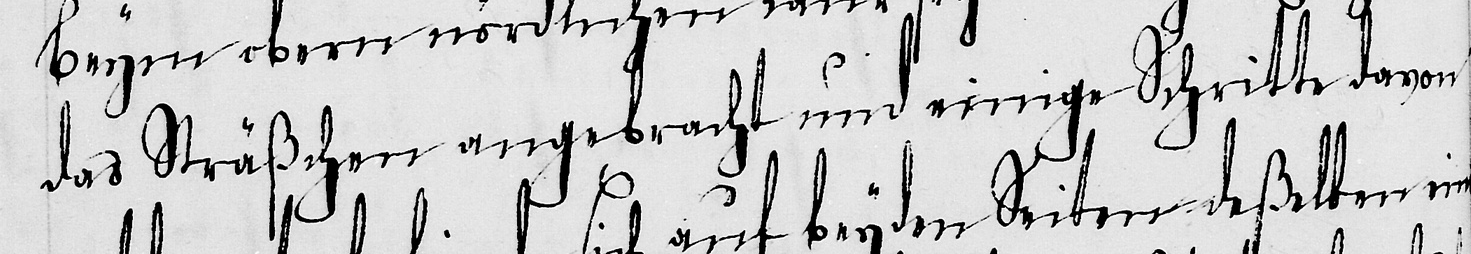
das Sräßchen angebracht und einige Schritte davon
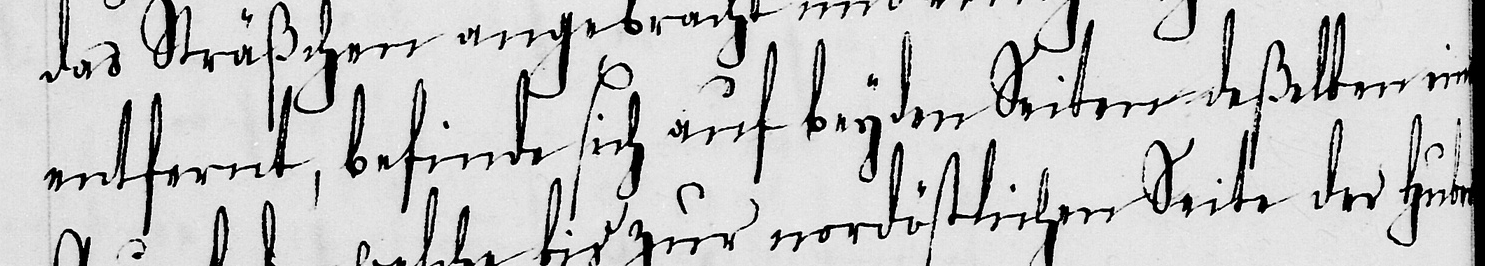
entfernt, befinde sich auf beyden Seiten deßelben
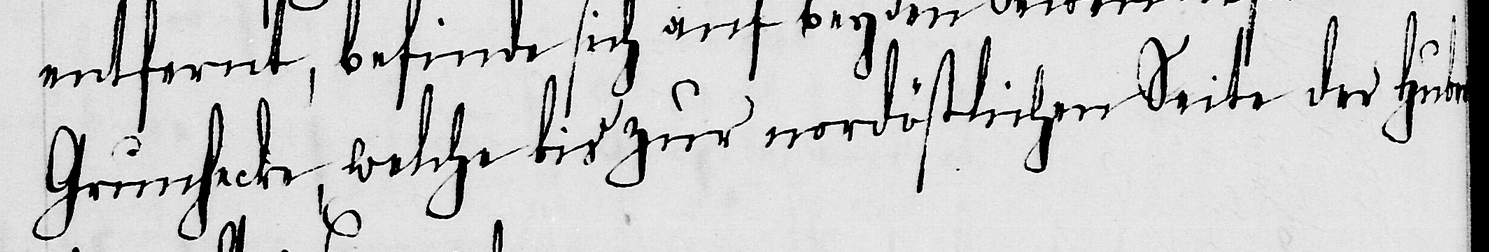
Grunhecke, welche bis zur nordöstlichen Seite der Hu¬
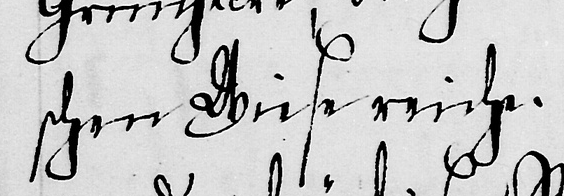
schen Wiese reiche.
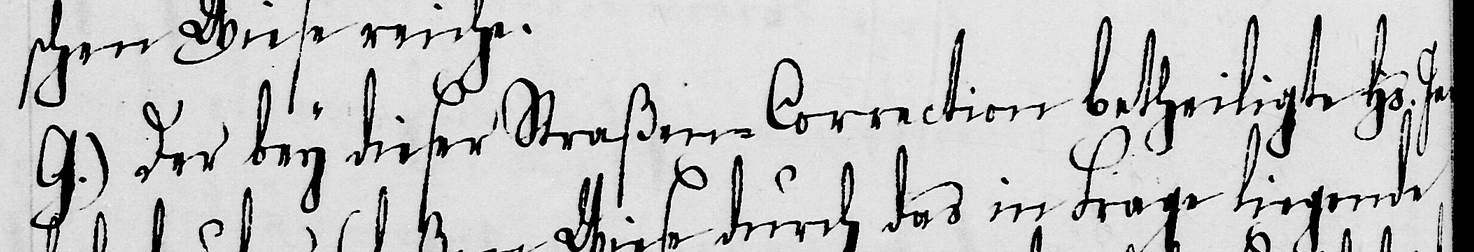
G.)Der bey dieser Straßen-Correction betheiligte Hs.
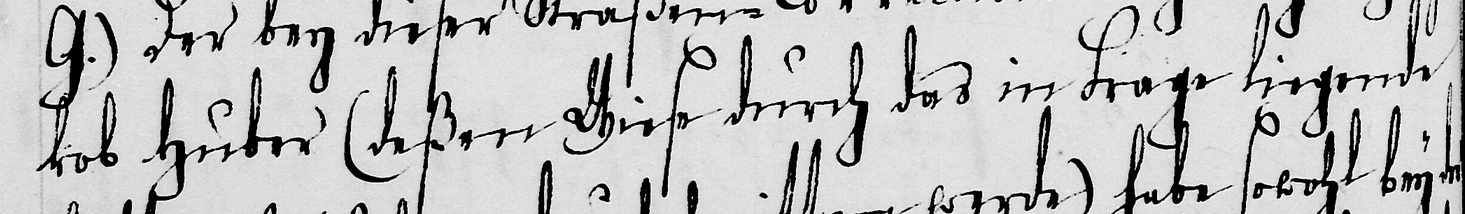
kob Huber (deßen Wiese durch das in Frage liegende
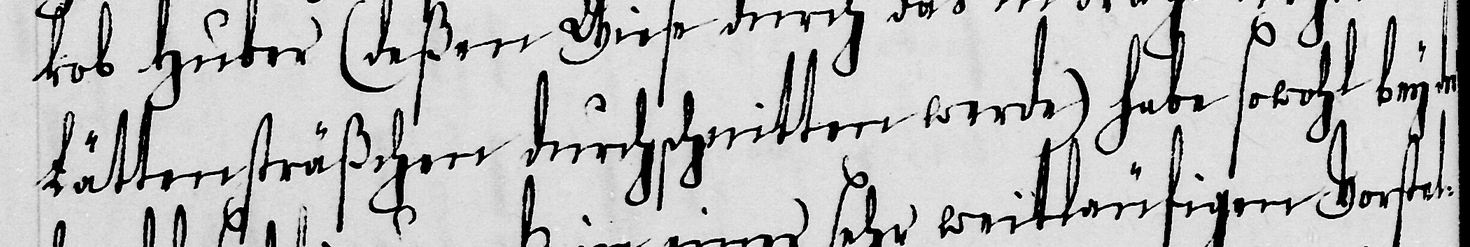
Lättensträßchen durchschnitten werde) habe sowohl bey
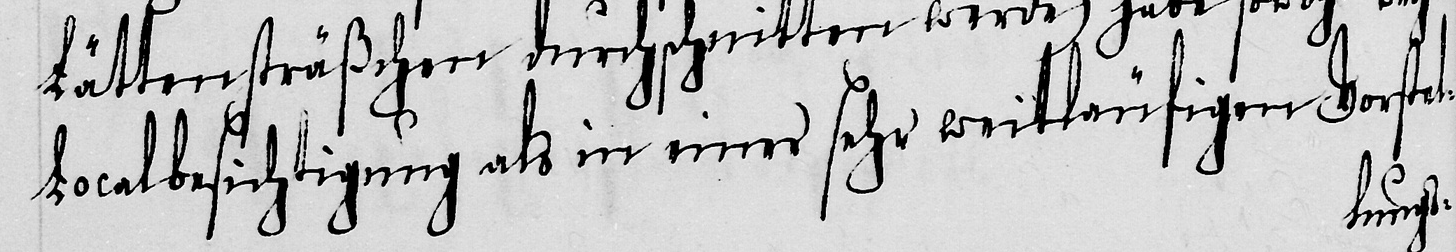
Localbesichtigung als in einer sehr weitläufigen Vorst¬
